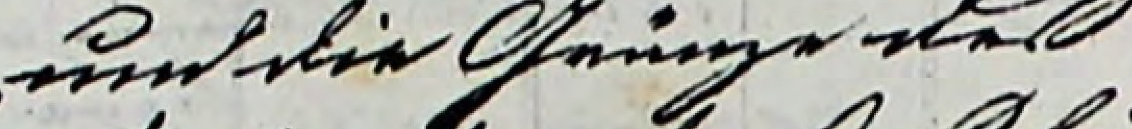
und die Grünze des
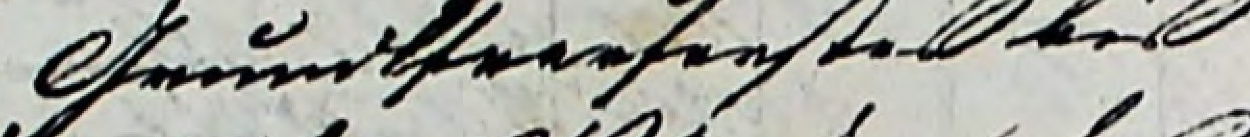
Grundtfrerferstes bis
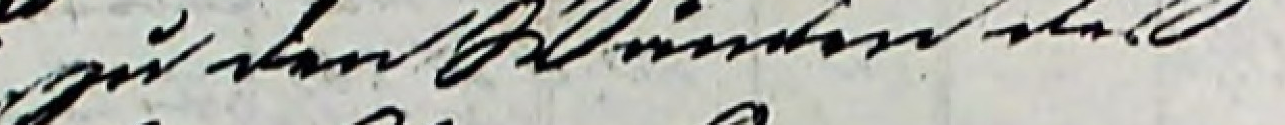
zu den Wänden des
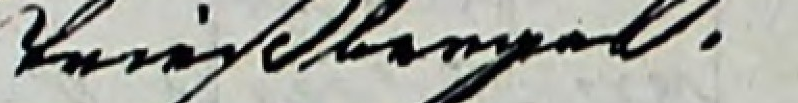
Trießberges.
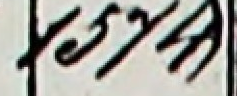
157/4
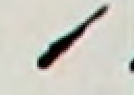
1
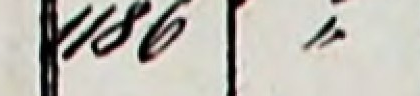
1186 „
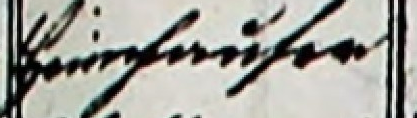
Heinchaufer
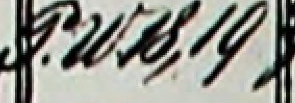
P.W. 18, 19
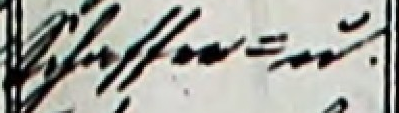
Schaffer = u.
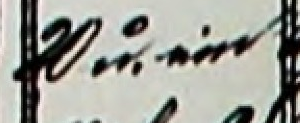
20 u. ein
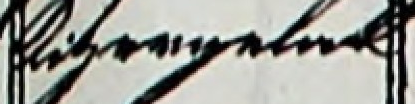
Kitzengelak
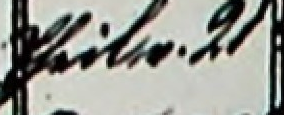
Theil v. 21
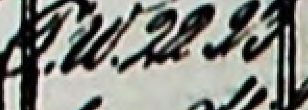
P.W. 22 23
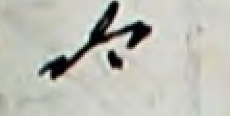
do
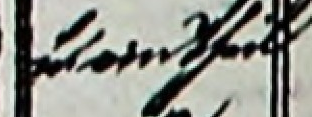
u ein Theil
